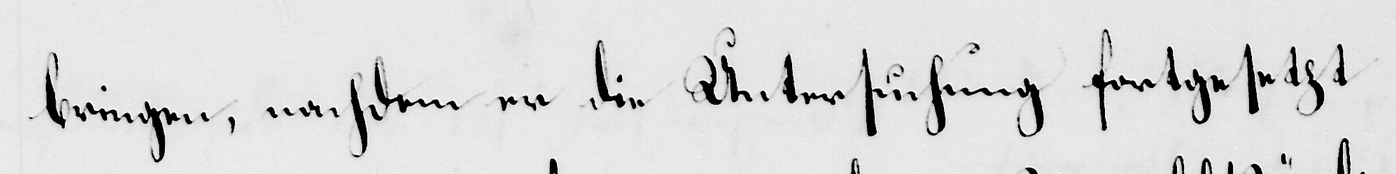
bringen, nachdem er die Untersuchung fortgesetzt
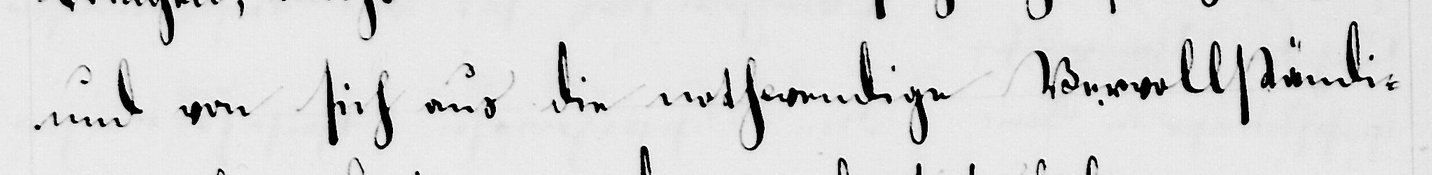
und von sich aus die nothwendige Vervollständi¬
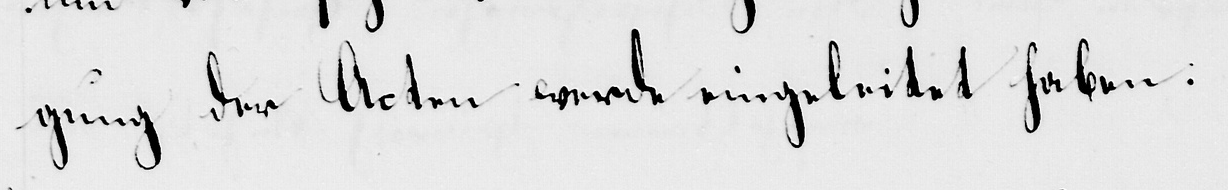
gung der Acten werde eingeleitet haben.
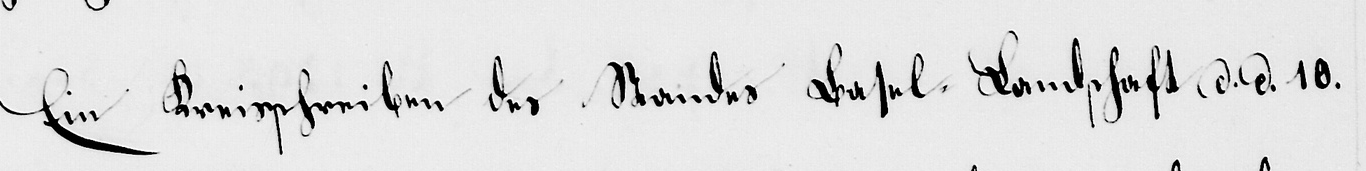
Ein Kreisschreiben des Standes Basel-Landschaft d. d. 10.
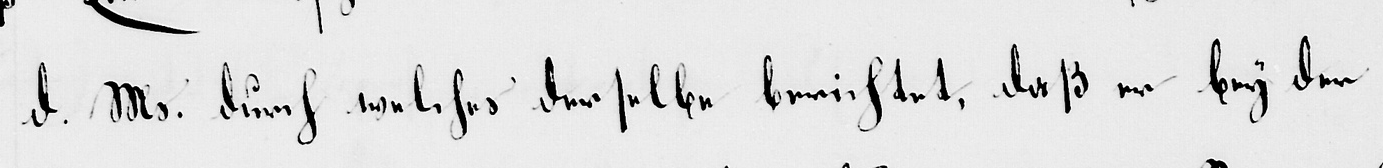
d. Ms. durch welches derselbe berichtet, daß er bey der
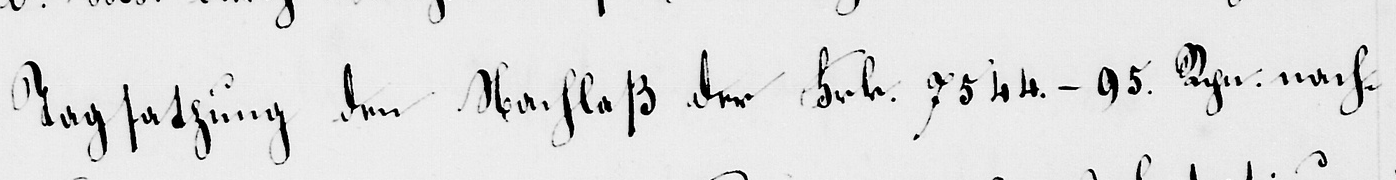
Tagsatzung den Nachlaß der Frk. 7544. – 95. Rpn. nach¬
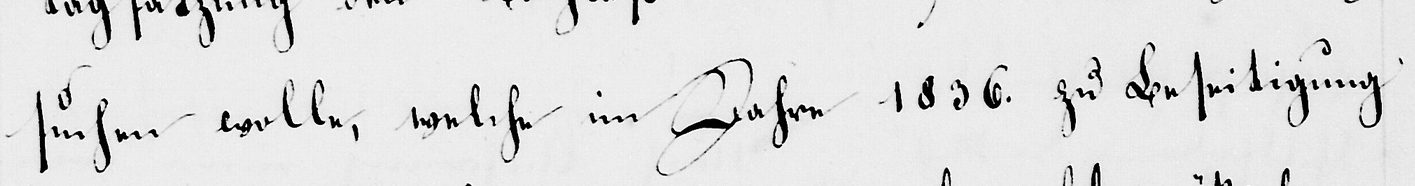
suchen wolle, welche im Jahre 1836. zu Beseitigung
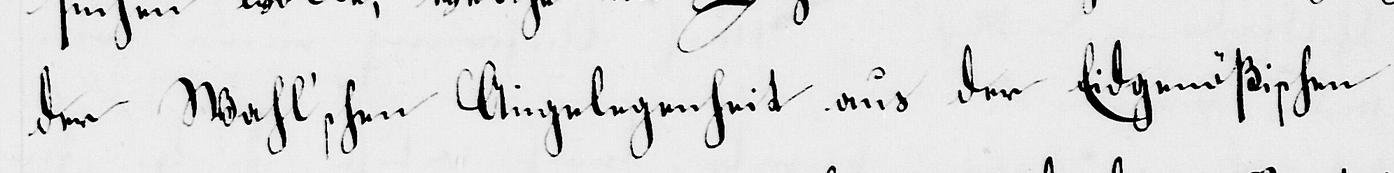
der Wahl’schen Angelegenheit aus der Eidgenößischen
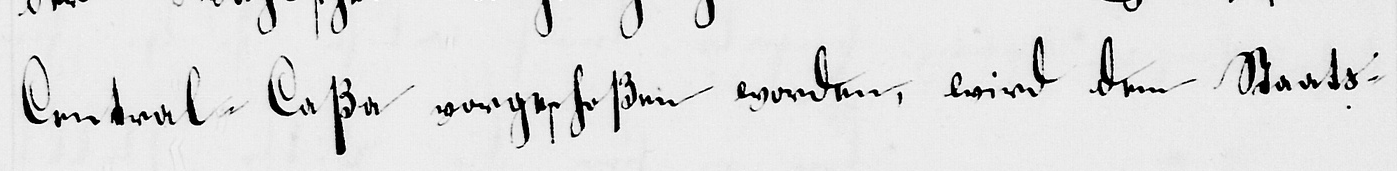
Central-Caßa vorgeschoßen worden, wird dem Staats¬
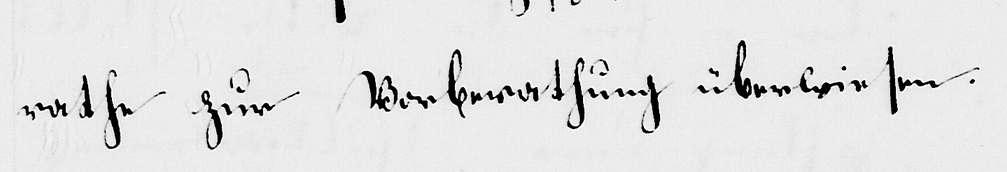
rathe zur Vorberathung überwiesen.
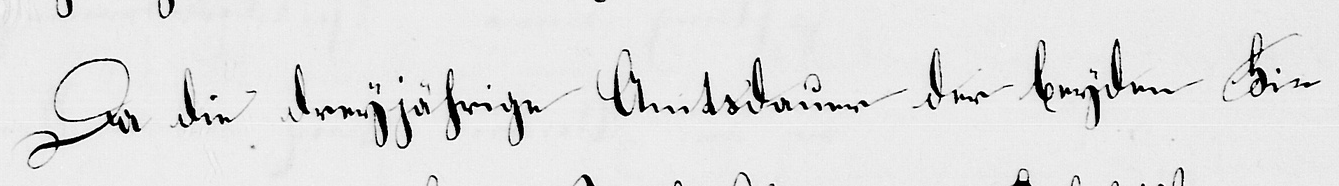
Da die dreyjährige Amtsdauer der beyden Fi¬
